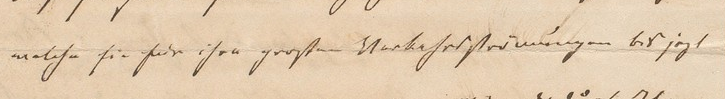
welche sie für ihre großen Verkehrsströmungen bis jezt
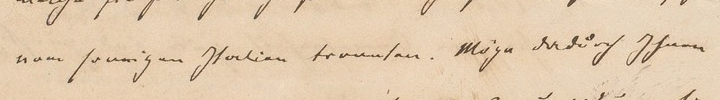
vom sonnigen Italien trennten. Möge dadurch Ihnen
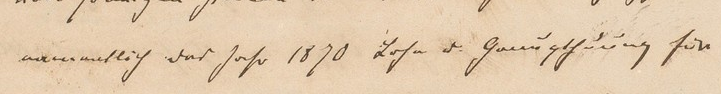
namentlich das Jahr 1870 Lohn u. Genugthuung für
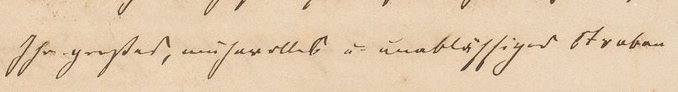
Ihr großes, mühevolles u unablässiges Streben
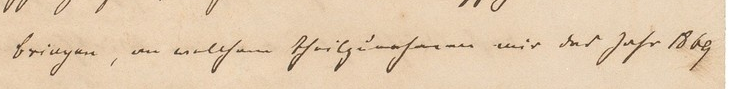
bringen, an welchem Theilzunehmen mir das Jahr 1869
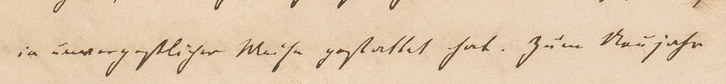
in unvergeßlicher Weise gestattet hat. Zum Neujahr
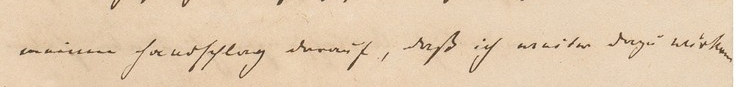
meinen Handschlag darauf, daß ich weiter dazu wirken
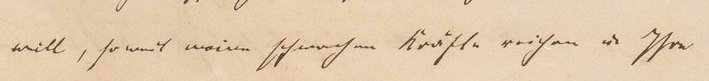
will, soweit meine schwachen Kräfte reichen u Ihre
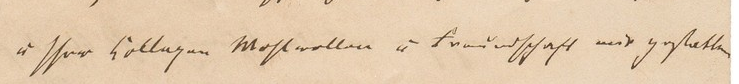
u Ihrer Collegen Wohlwollen u Freundschaft mir gestatten
